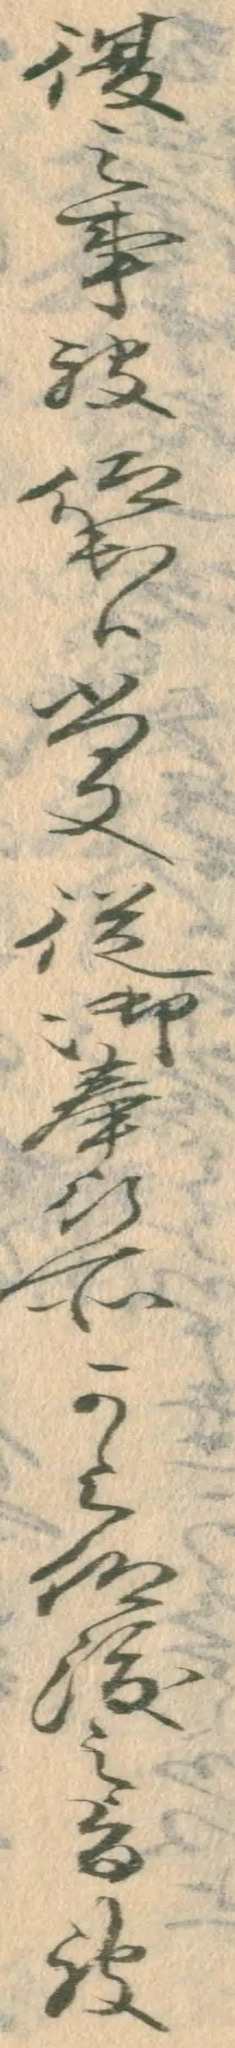復之事被仰出候尚又従御奉行所可被仰渡之旨被
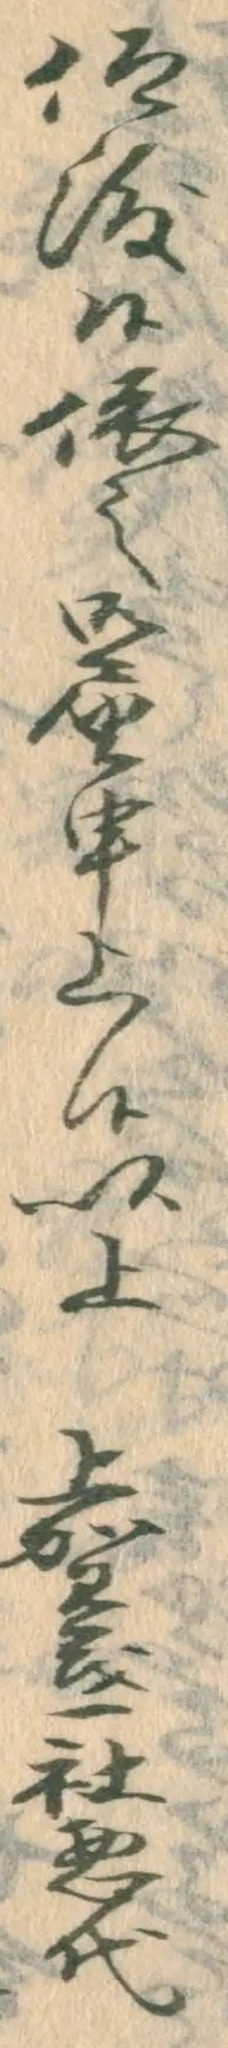仰渡候依之御届申上候以上上賀茂一社惣代
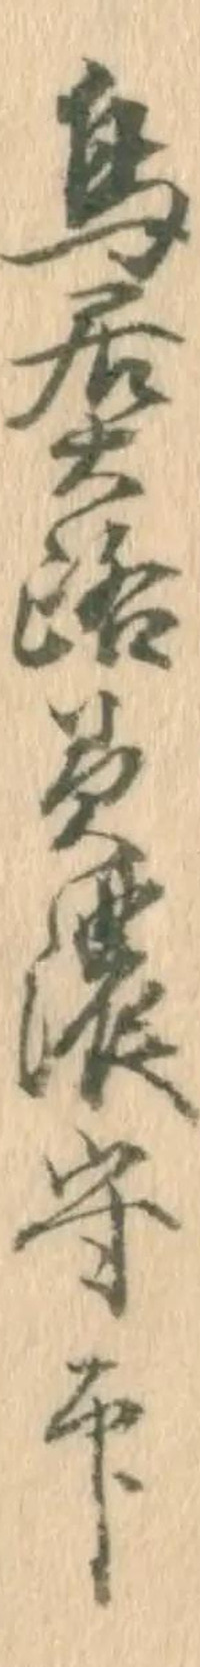鳥居大路美濃守印
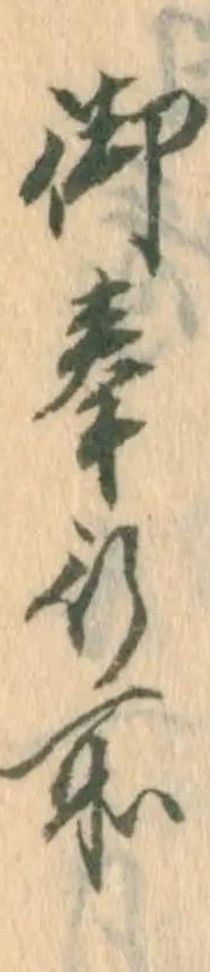御奉行所

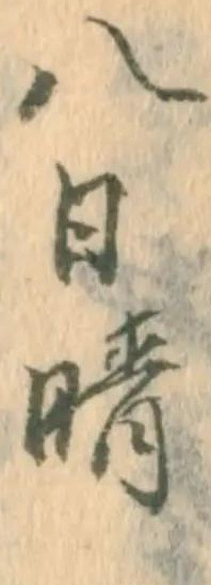八日晴
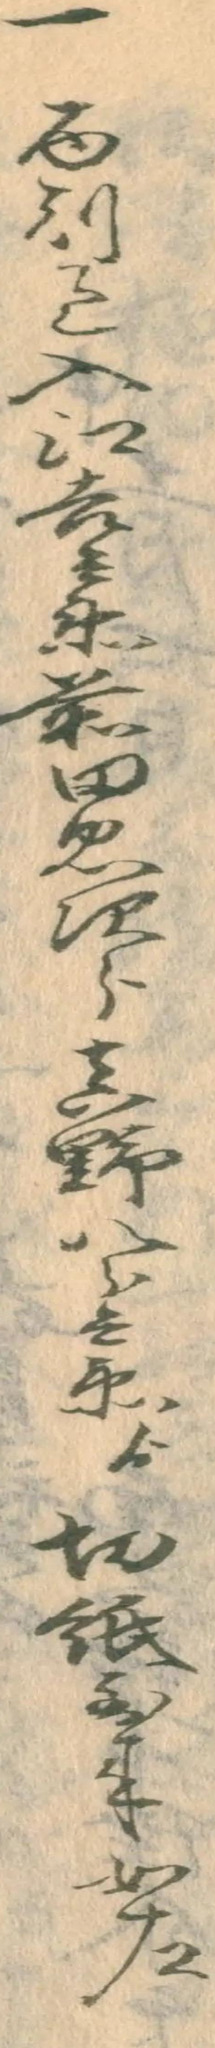一酉刻過入江吉兵衛前田忠次郎真野八郎兵衛ゟ切紙到来如左
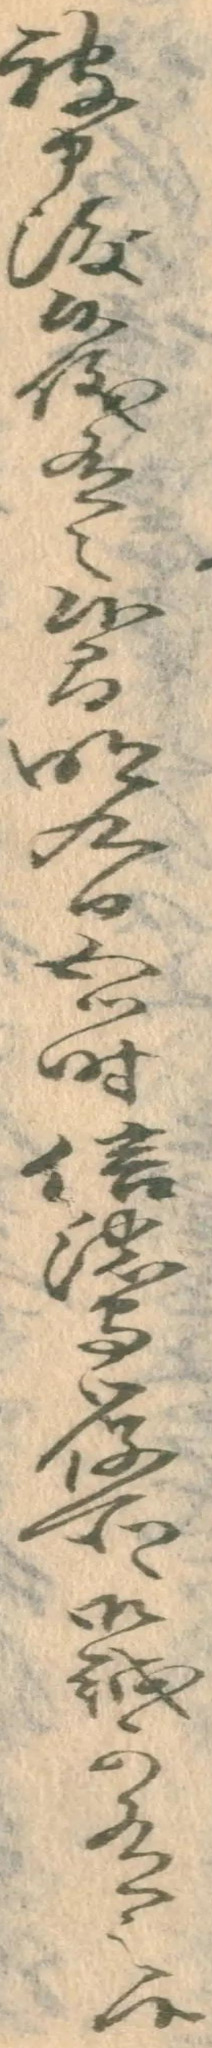被申渡候儀有之候間明九日五ツ時信濃守御役所へ御越可有之候
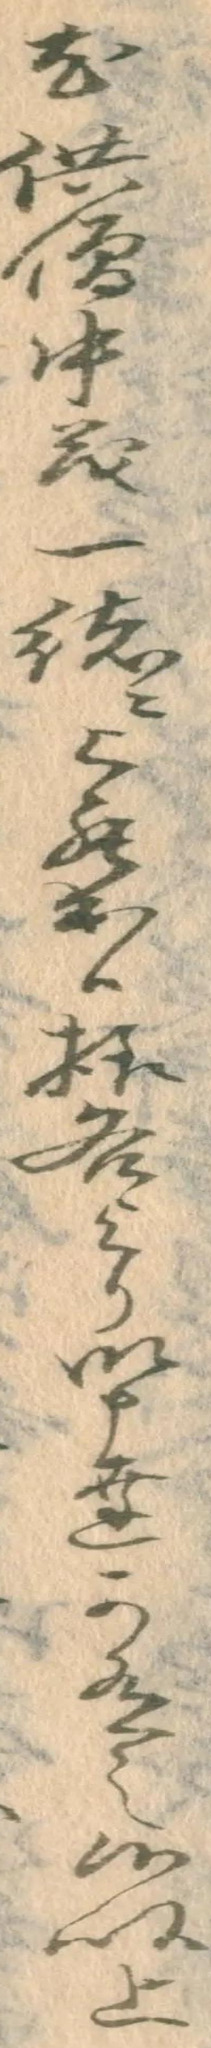尤供僧中茂一緒ニ被罷出候様各より御申達可有之候以上
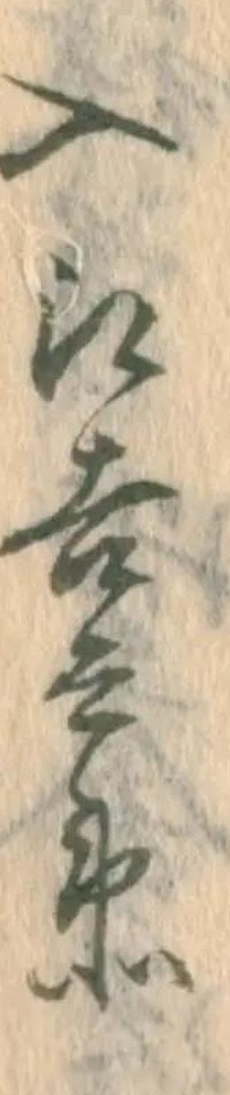入江吉兵衛
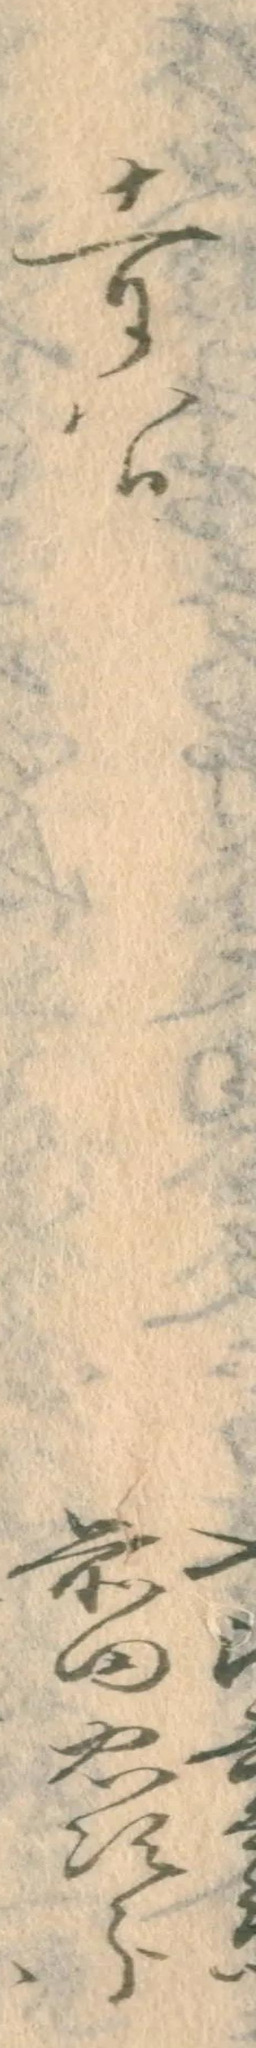十一月八日前田忠次郎
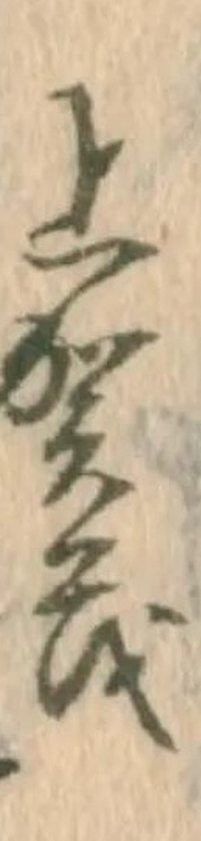上賀茂
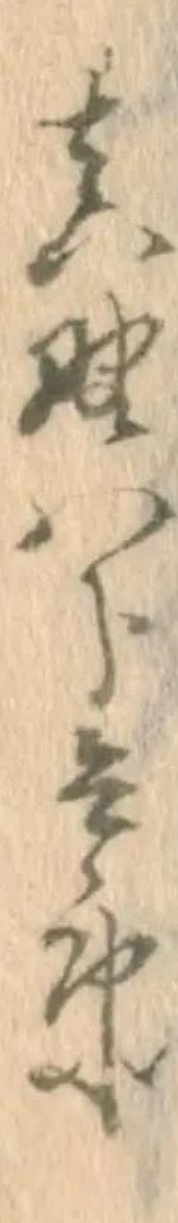真野八郎兵衛
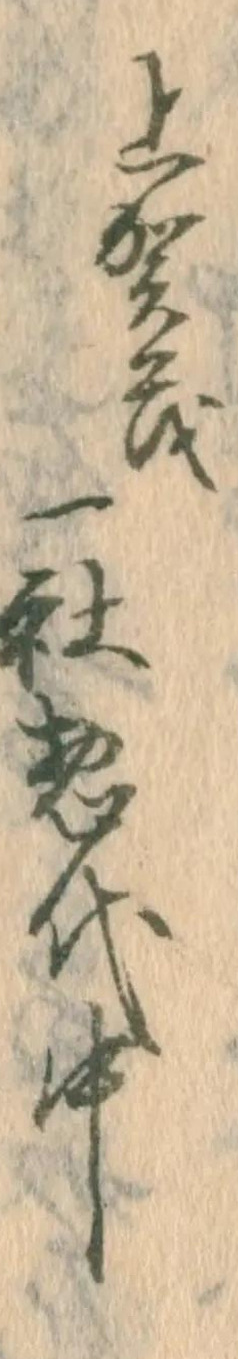一社惣代中
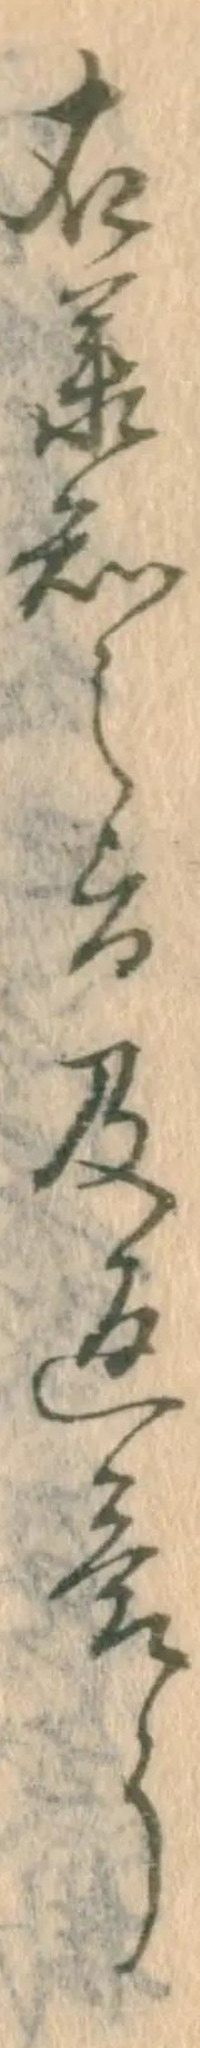右承知之旨及返答了
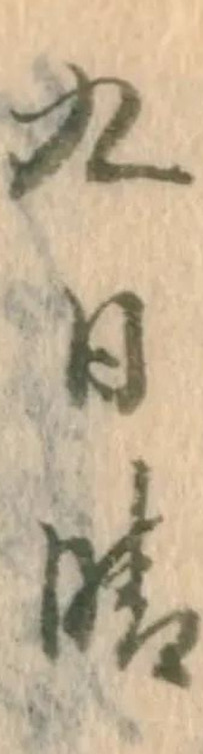九日晴
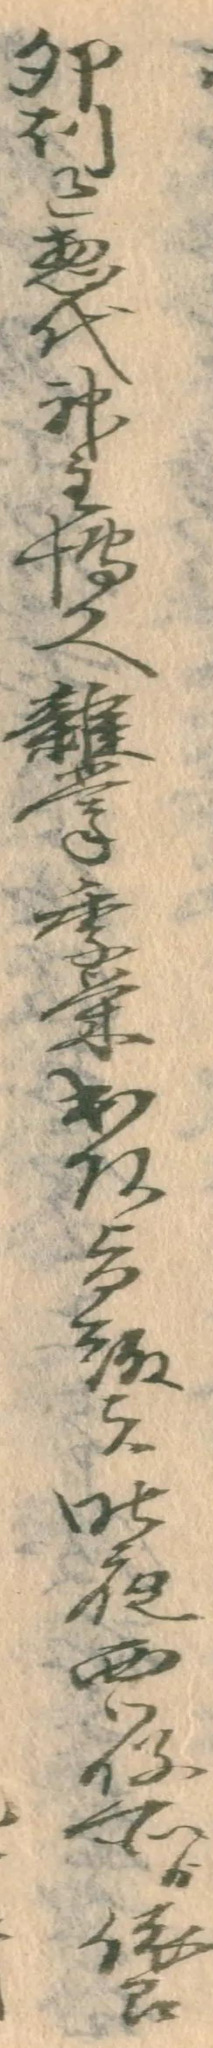一卯刻過惣代神主博文雑掌季栄出頭旨趣は昨夜西御役所ゟ依召
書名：賀茂社記録. 第17冊
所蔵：国立国会図書館 National Diet Library, JAPAN
